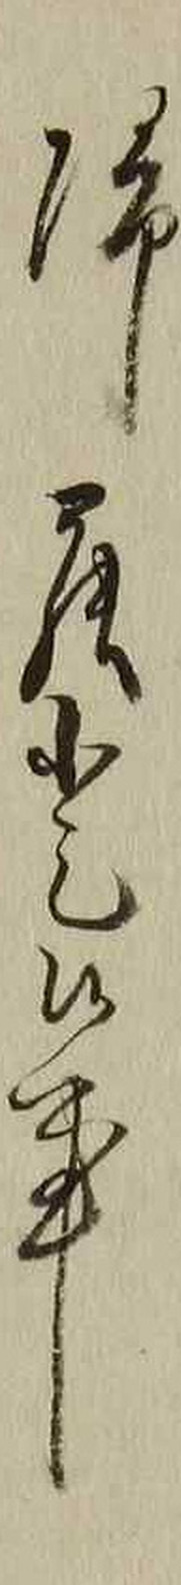帰罷登候事
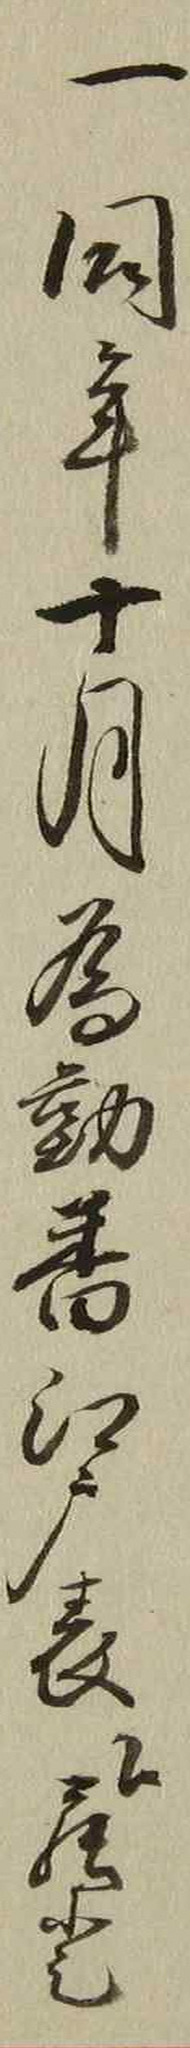一同年十月為勤番江戸表江罷登
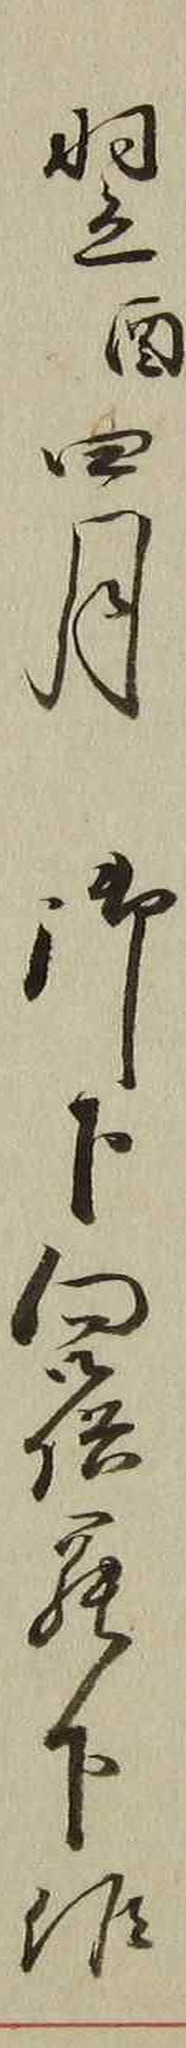翌酉四月御下向御供罷下候
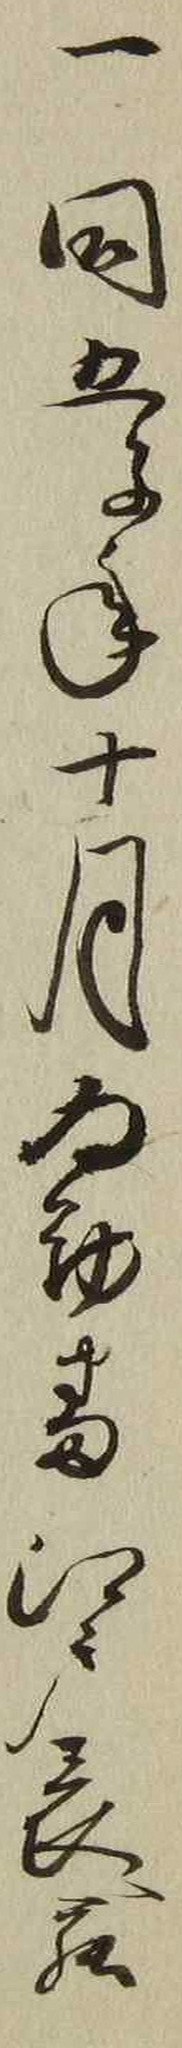一同五子年十月為勤番江戸表へ罷
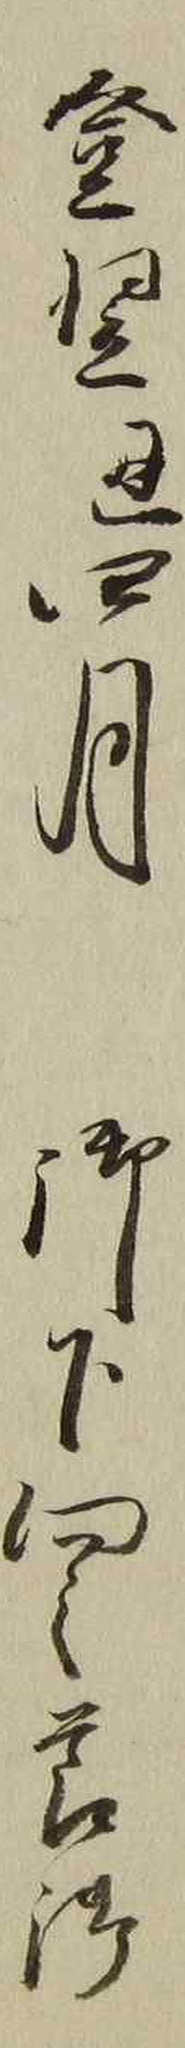登翌丑四月御下向之節御
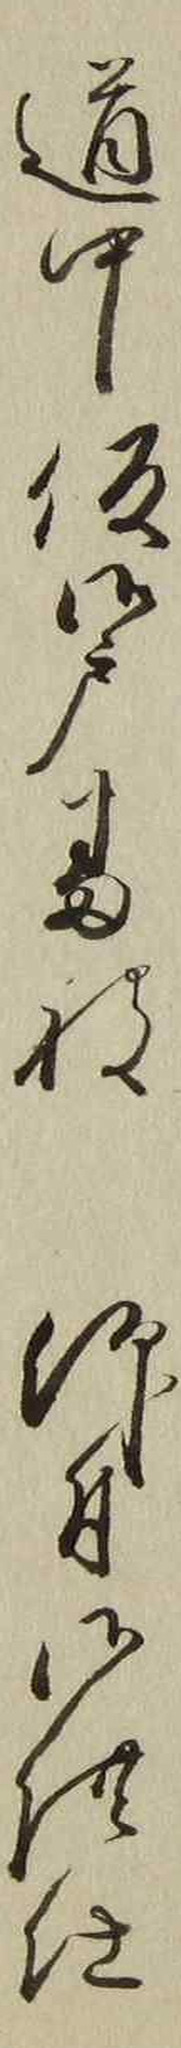道中仮江戸番被仰付御供仕
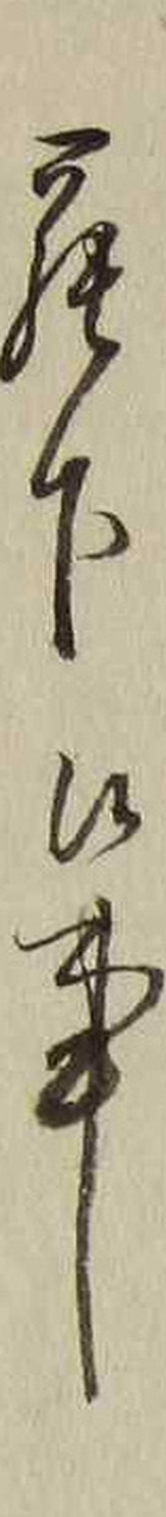罷下候事
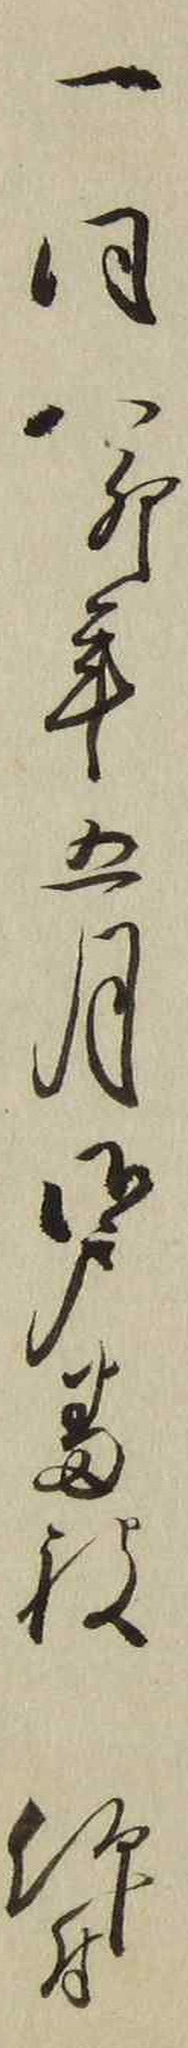一同八卯年五月江戸番被仰付

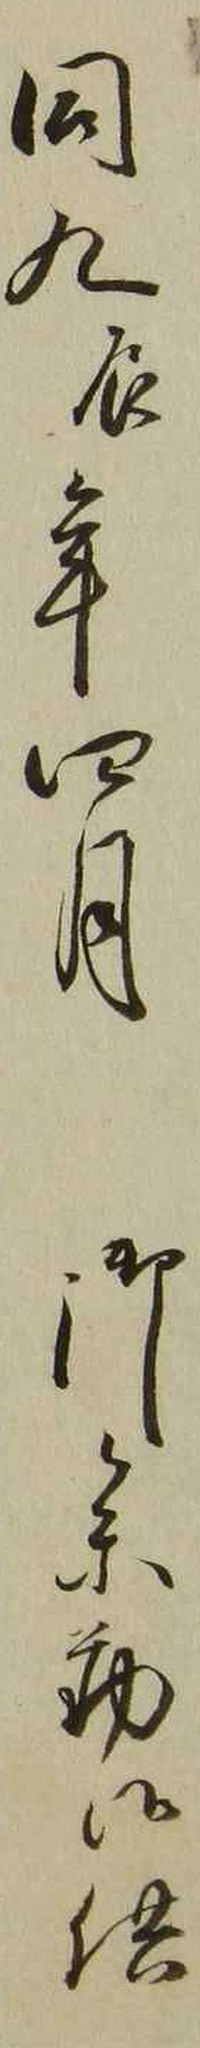同九辰年四月御参勤御供
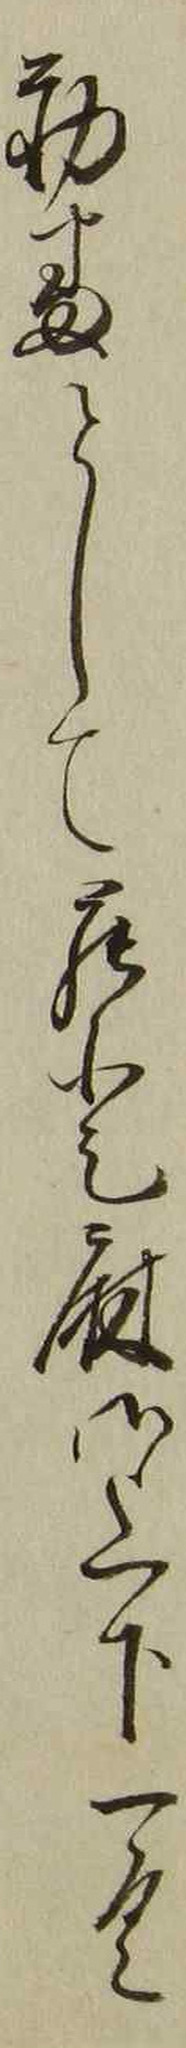勤番として罷登麻御上下一具
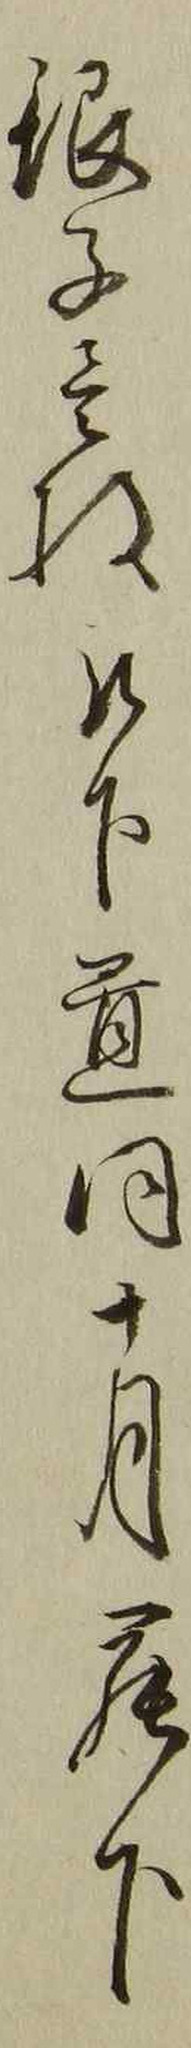銀子壱枚被下置同十月罷下
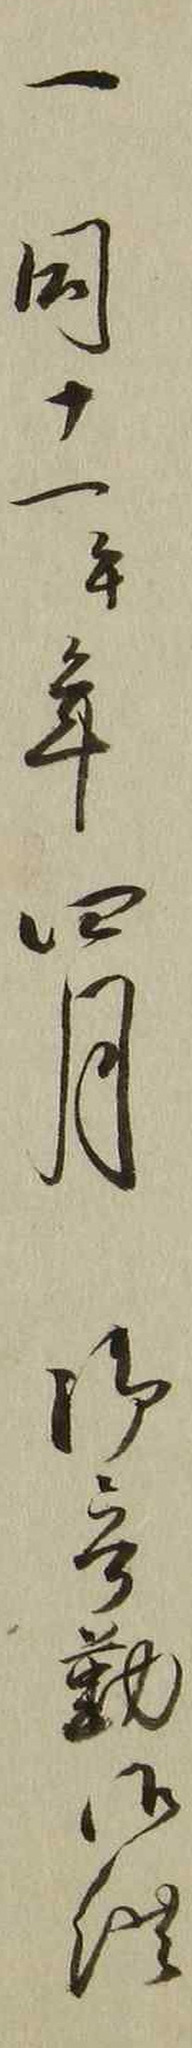一同十一午年四月御参勤御供
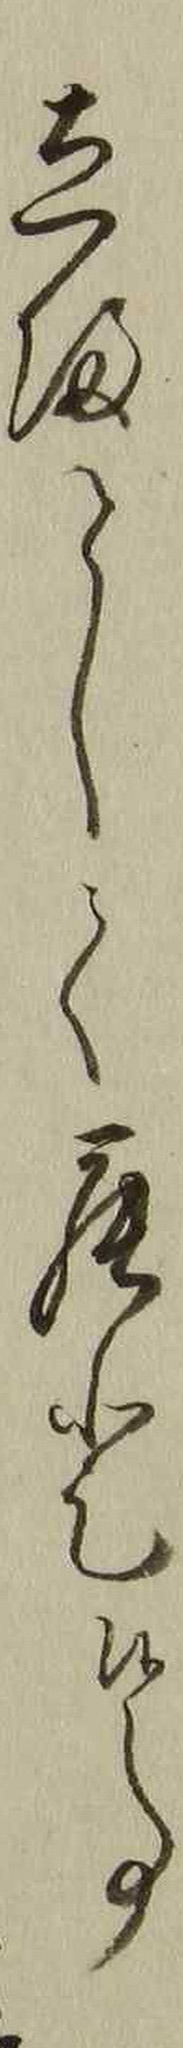立帰として罷登候事
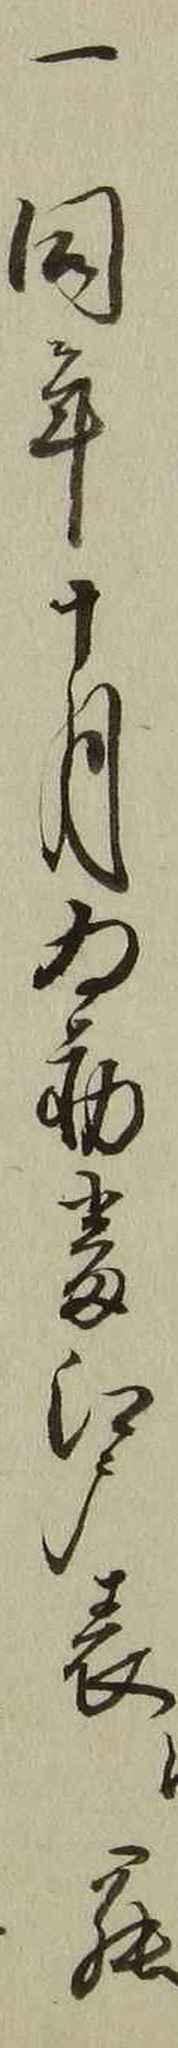一同年十月為勤番江戸表江罷
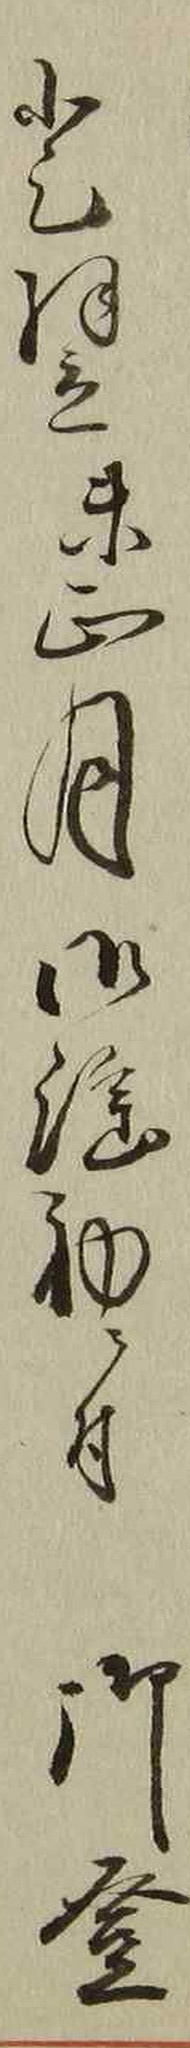登翌未正月御謡初ニ付御登
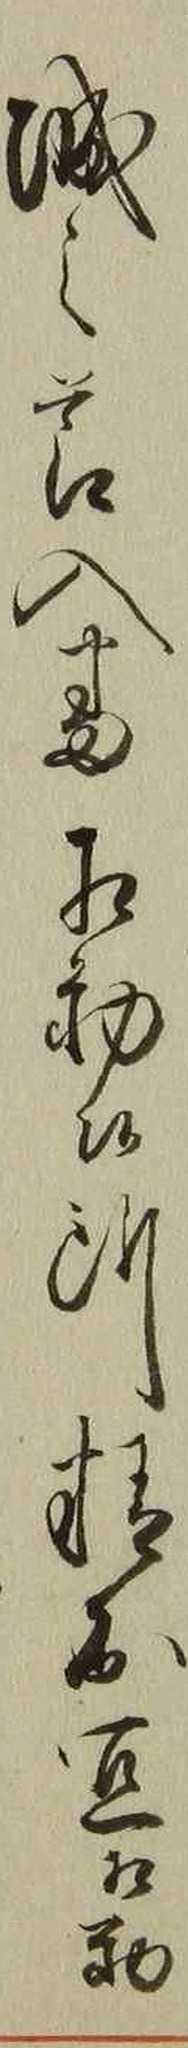城之節入番相勤候所精出宜相勤
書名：諸士系譜　巻之2　い之部2
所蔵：会津若松市立会津図書館
